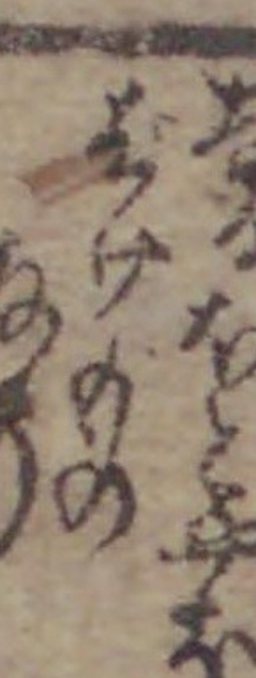ばけもの
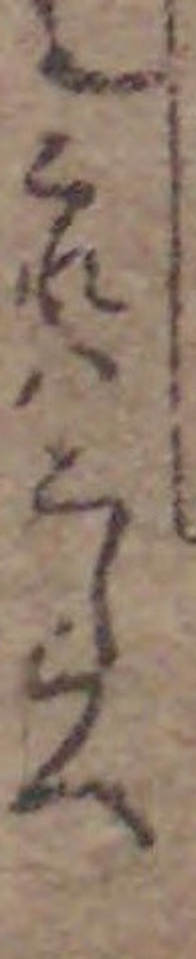これはこしらへ
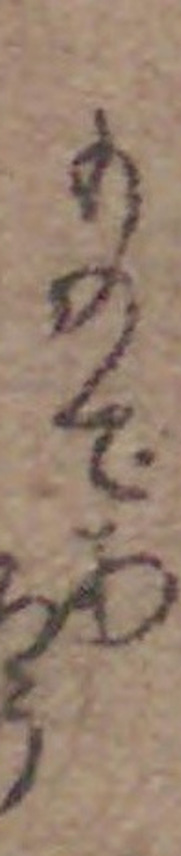ものであ

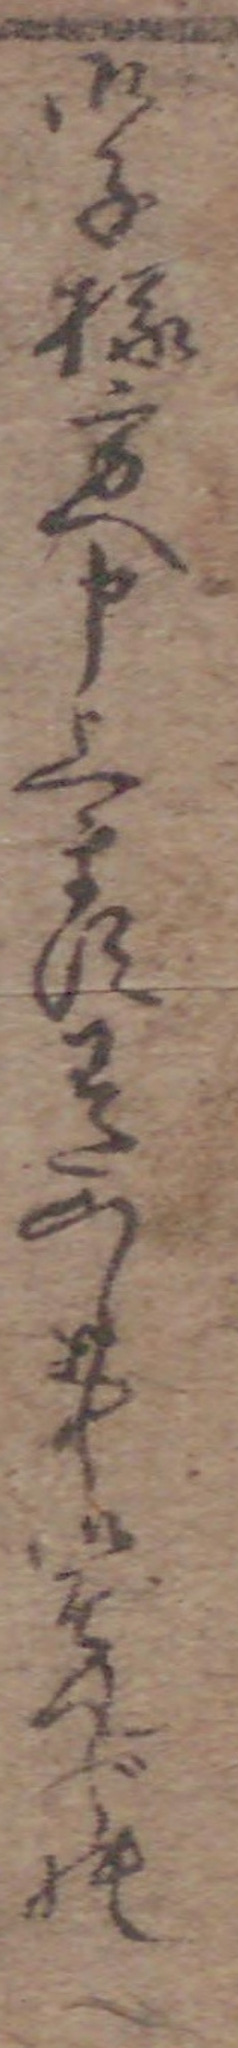御子様方へ申上ますわたくし御そんじの
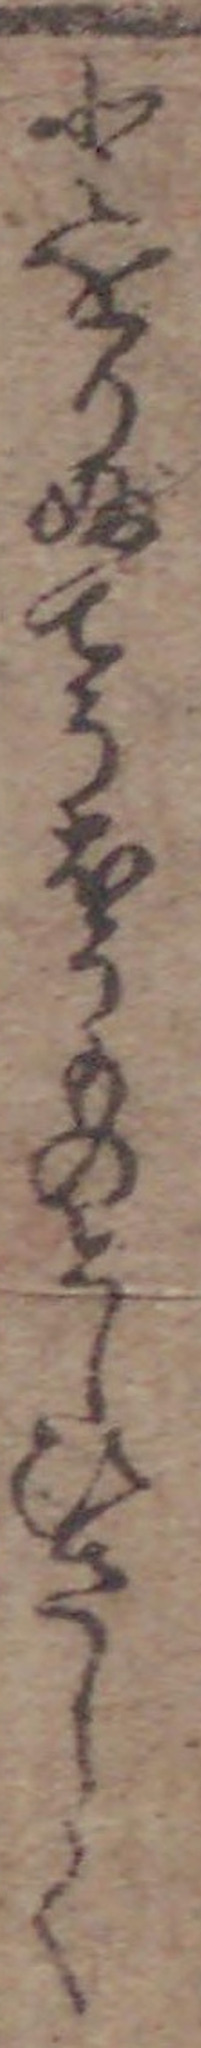とをりふてうほうものとてひさしく
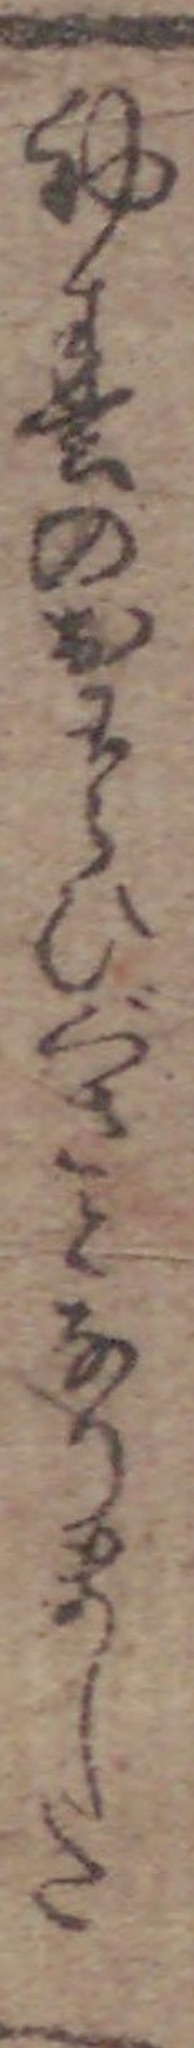初春のおわらひぐさとなりました
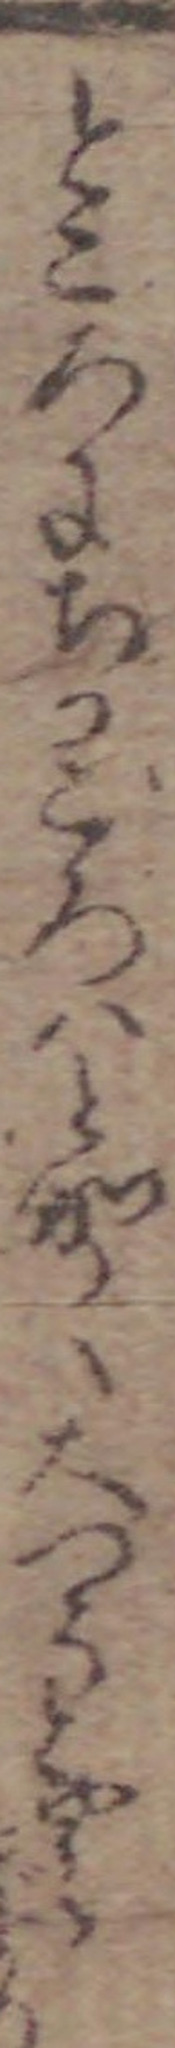ところにちかごろはとかく大つうとやら
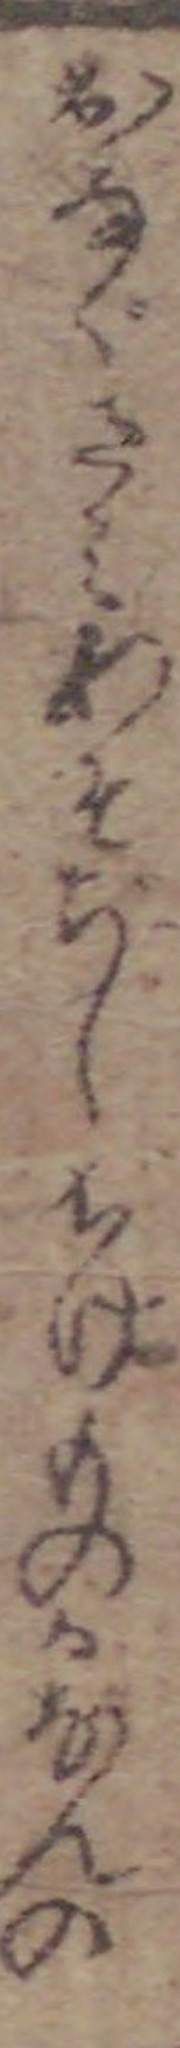おなぐさみあそはしはけものかなんの
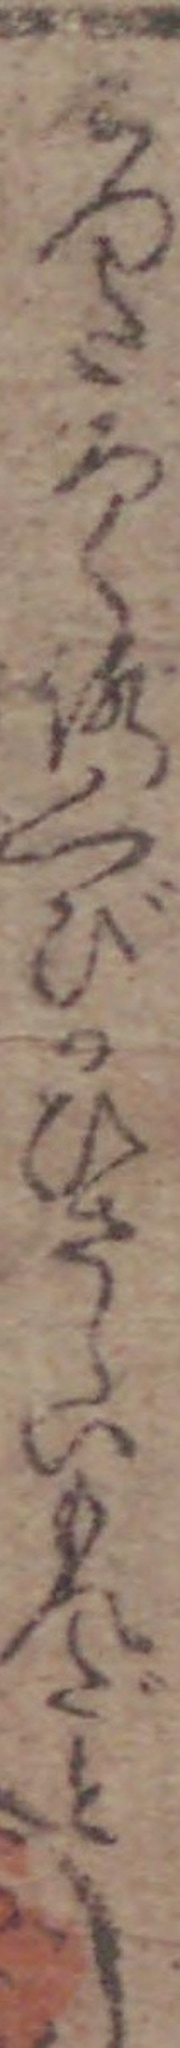こつたろくろくびかひさしいもんだと
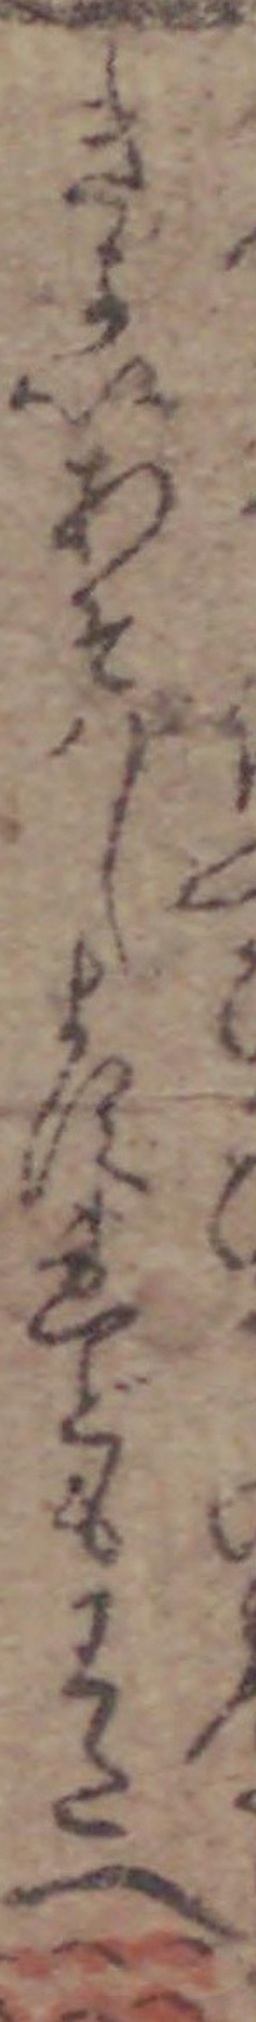きよいあそはしますれどもわた
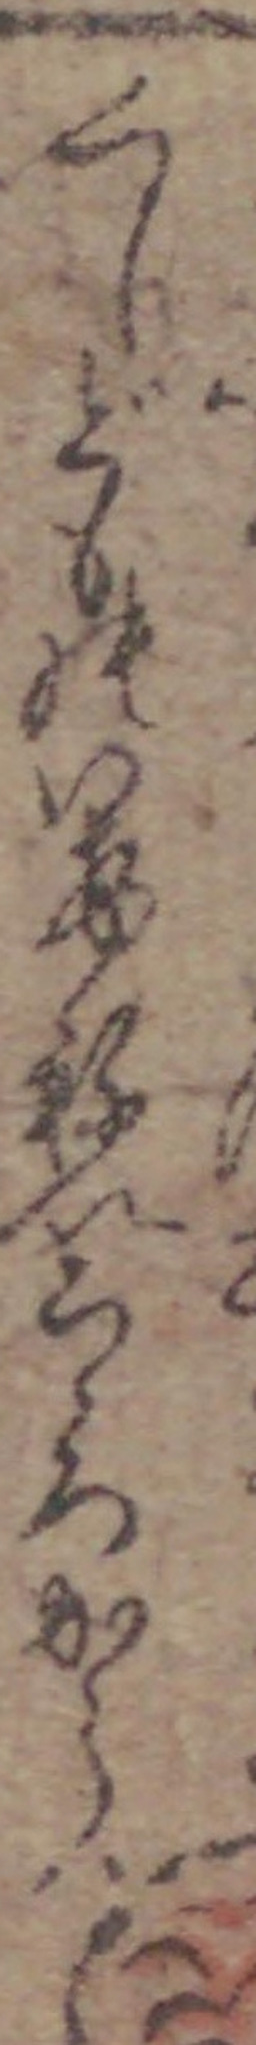くしどものいねいこゝろからは
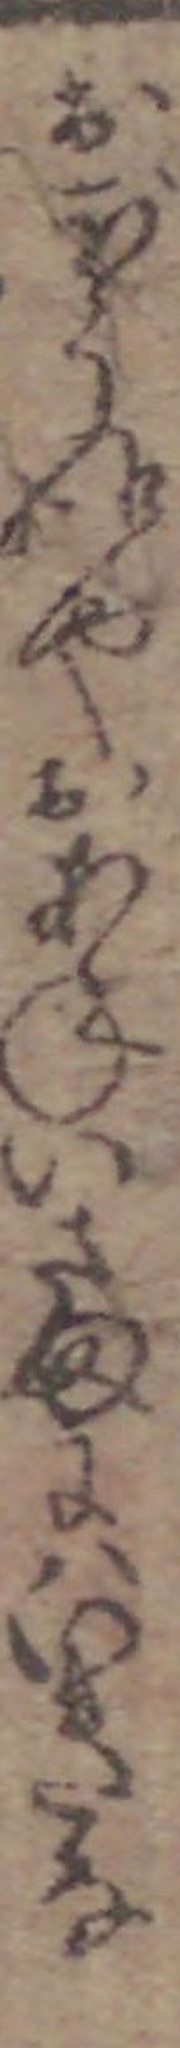おぼう様やおあねいさまにはいきな
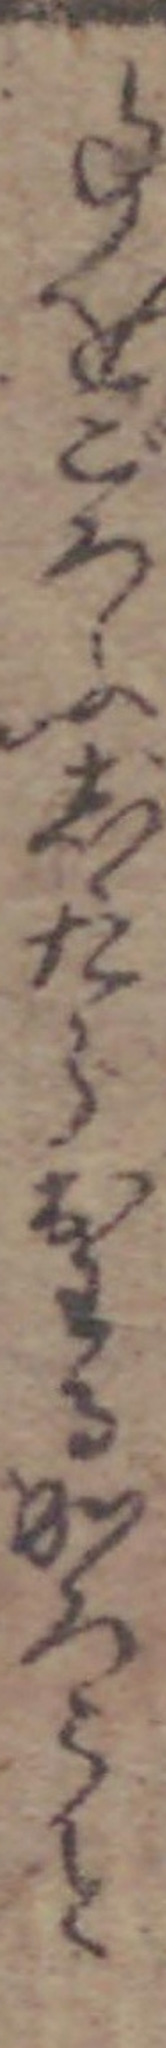事をごろふじたらおわるかろうと
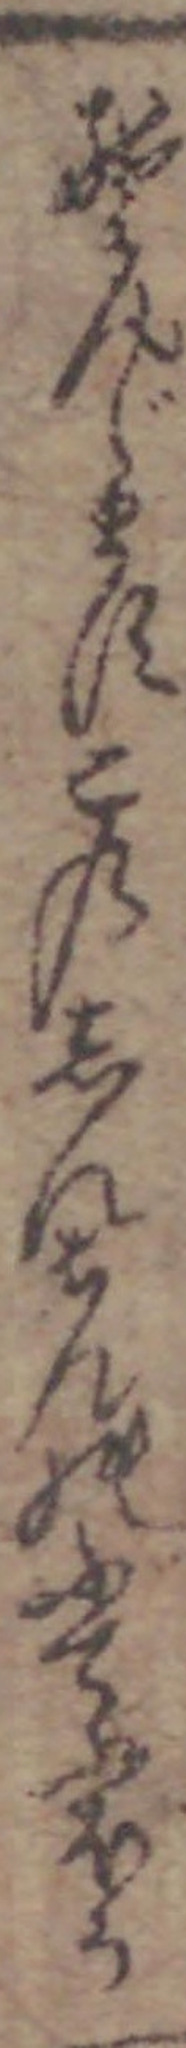おもんじますこのしんはんのふてふほう
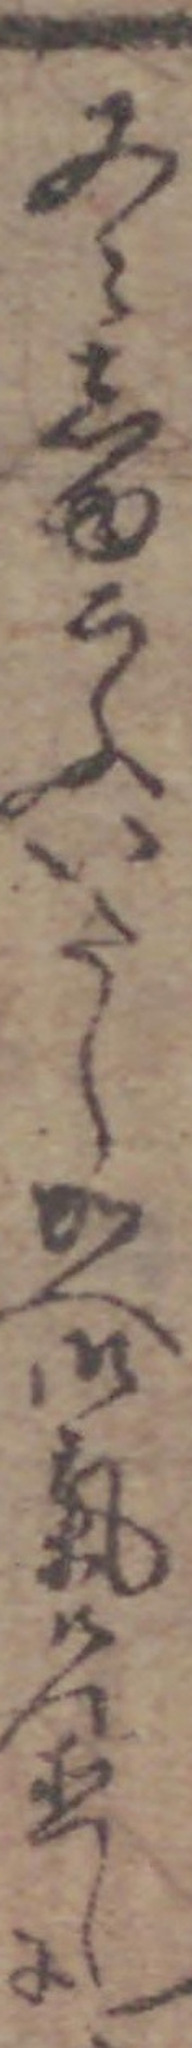又々しゆこふいたしかへ御気けん直しに
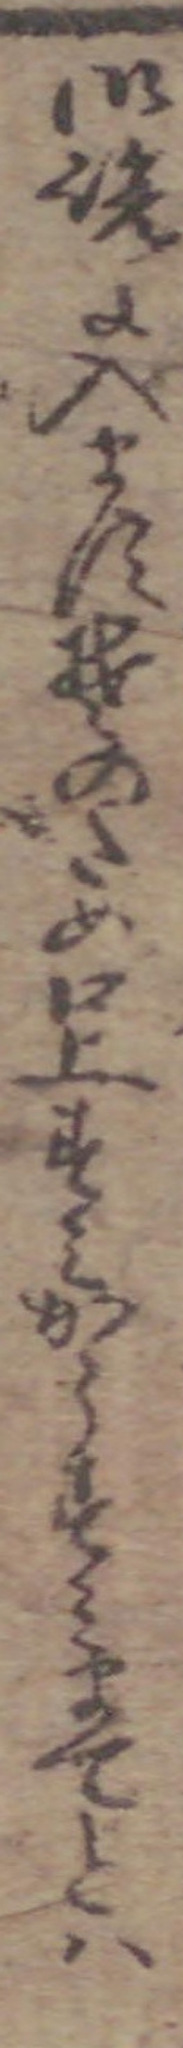御覧に入ますそのため口上すみからすみまてとは
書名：化物鼻がひしげ 2巻
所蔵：国立国会図書館 National Diet Library, JAPAN
